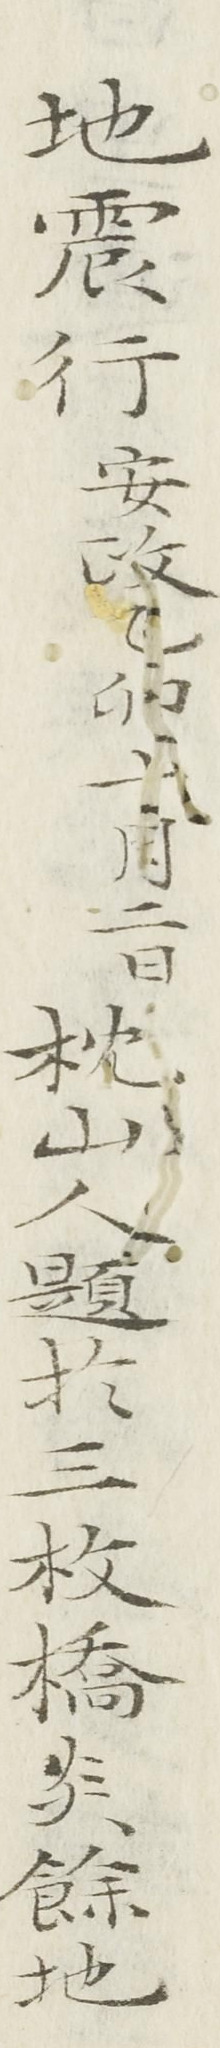地震行安政乙卯弐月二日枕山人題於三枚橋炎餘地
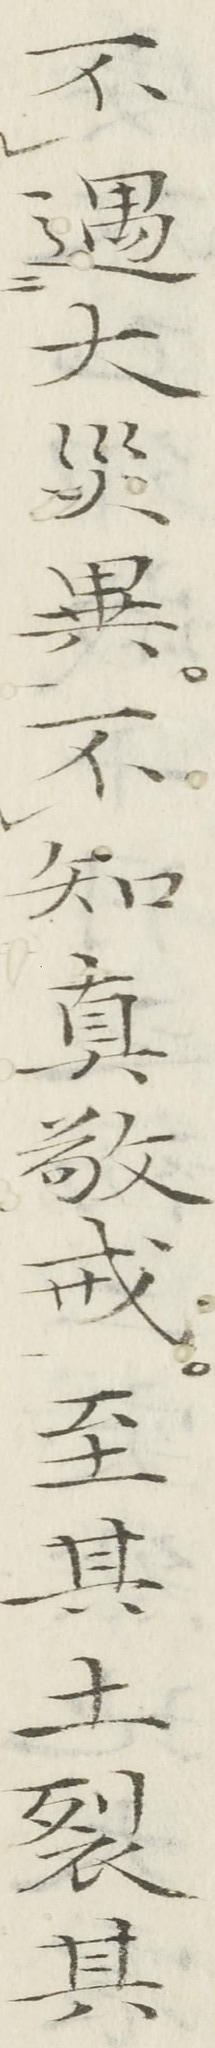不遇大災異不知真敬戒至其土裂其
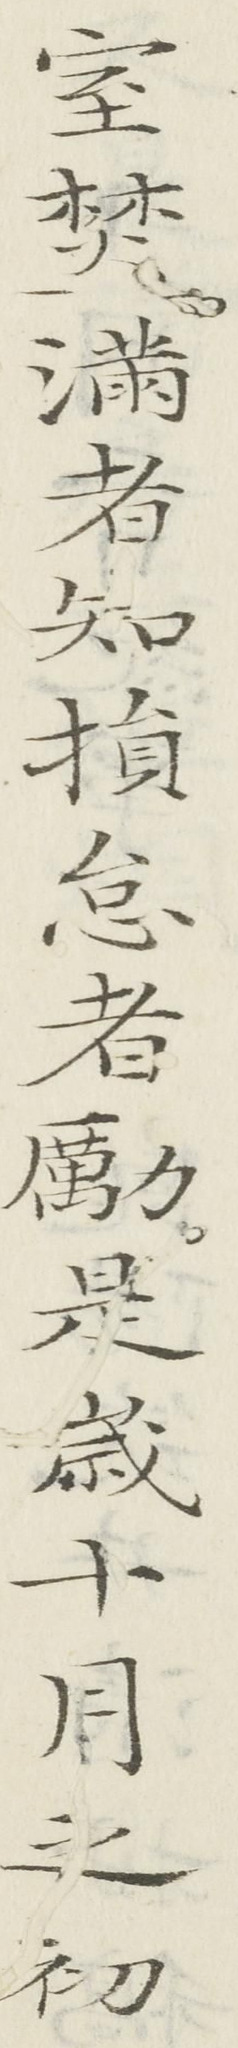室焚満者知損怠者励シ是歳十月之初
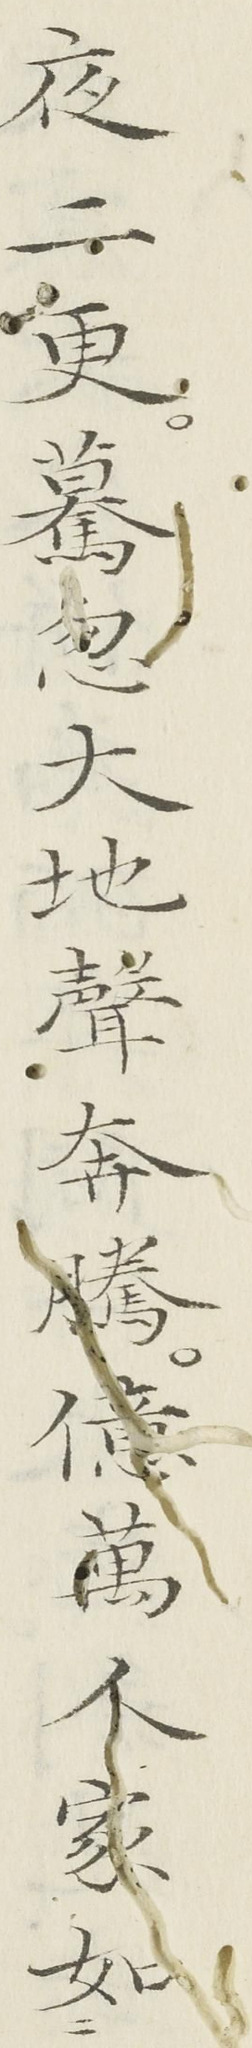夜二更驀忽大地声奔騰億万人家如
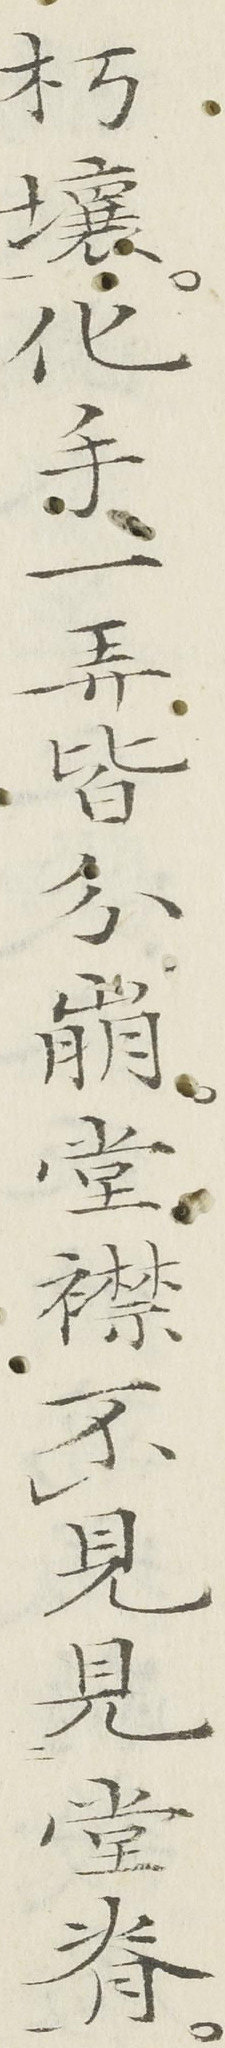朽壌化手一弄皆分崩堂襟不見見堂背
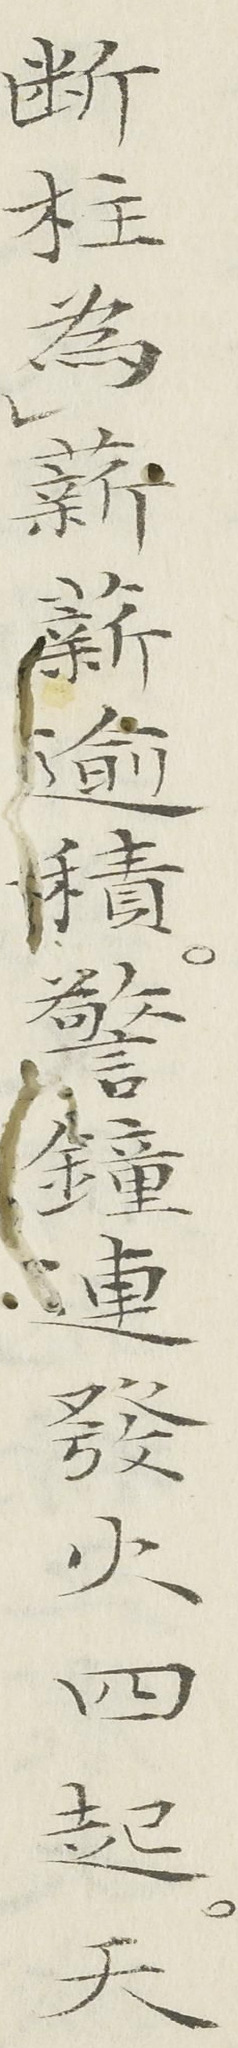断柱為薪薪逾積警鐘連發火四起天魚
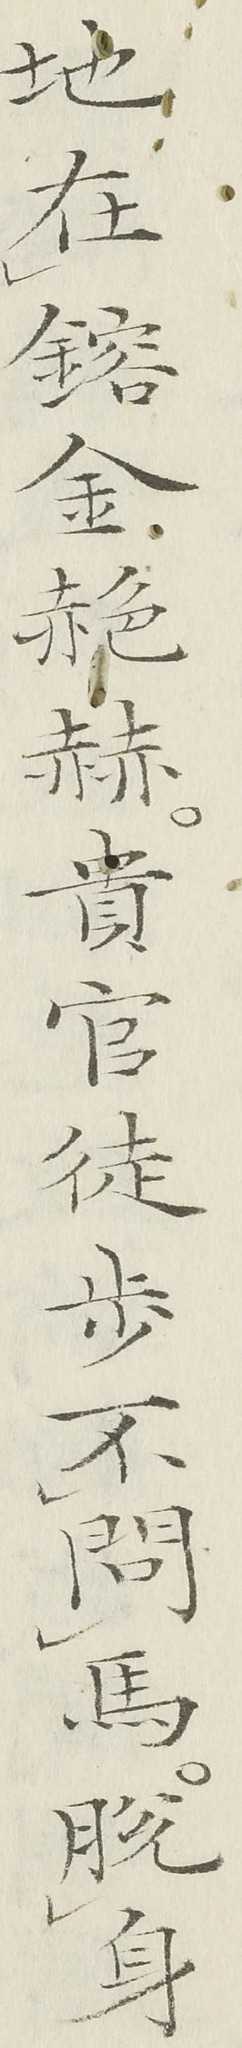地在鎔金赩赫貴官徒歩不問馬脧身
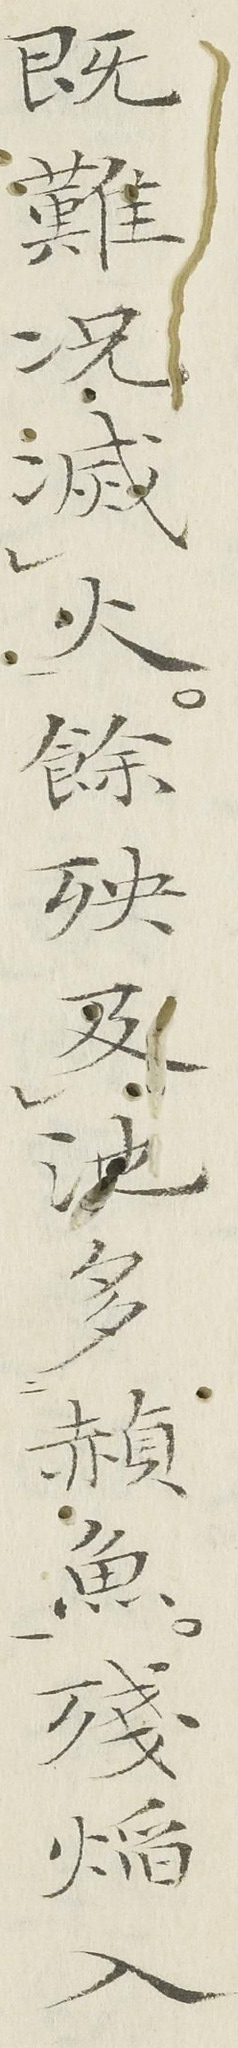既難況滅火餘殃及池多頳魚残焔入
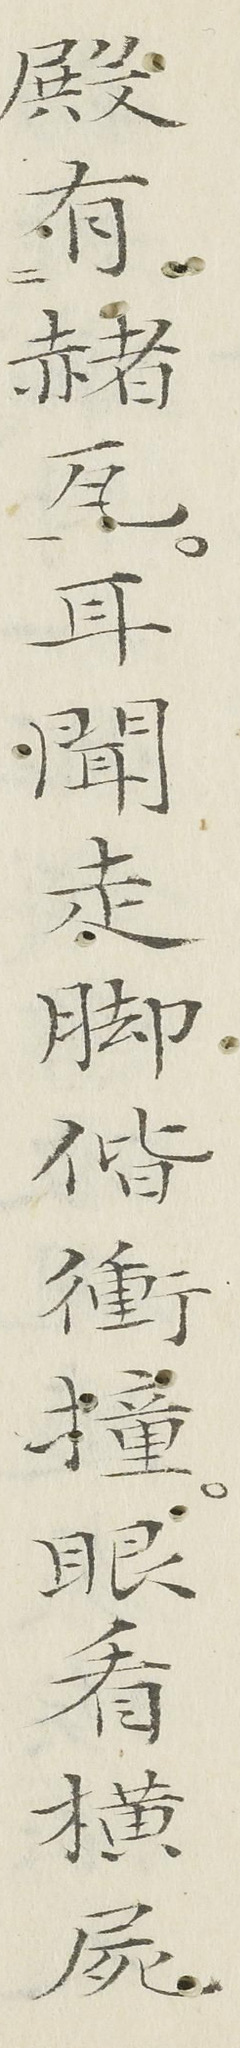殿有赭瓦耳聞走脚偕衝撞眼看横屍
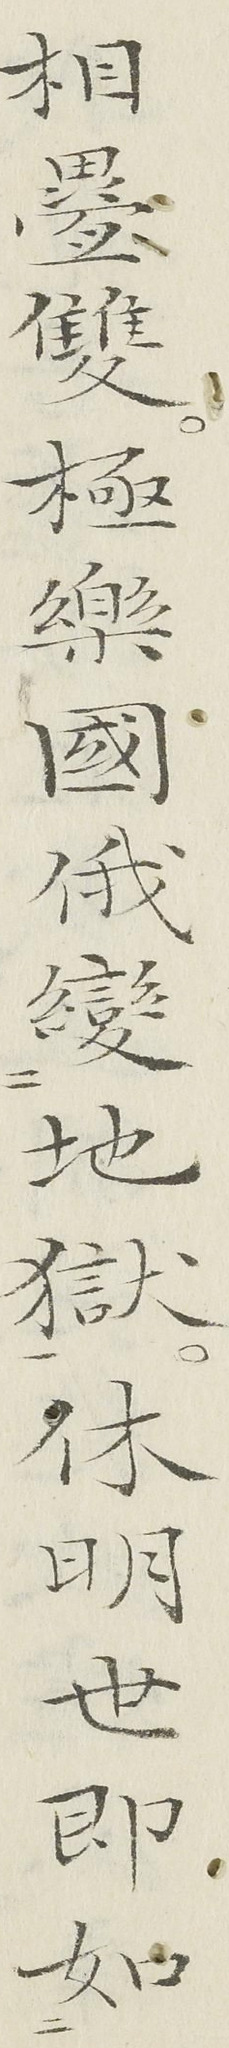相疂雙極楽国我変地獄休明世即如
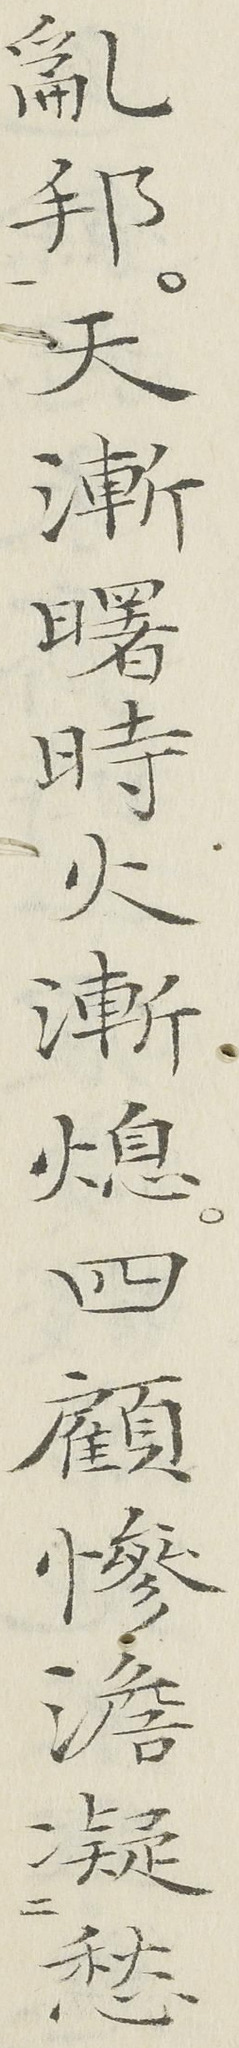乱邦天漸曙時火漸熄四顧惨憺凝愁

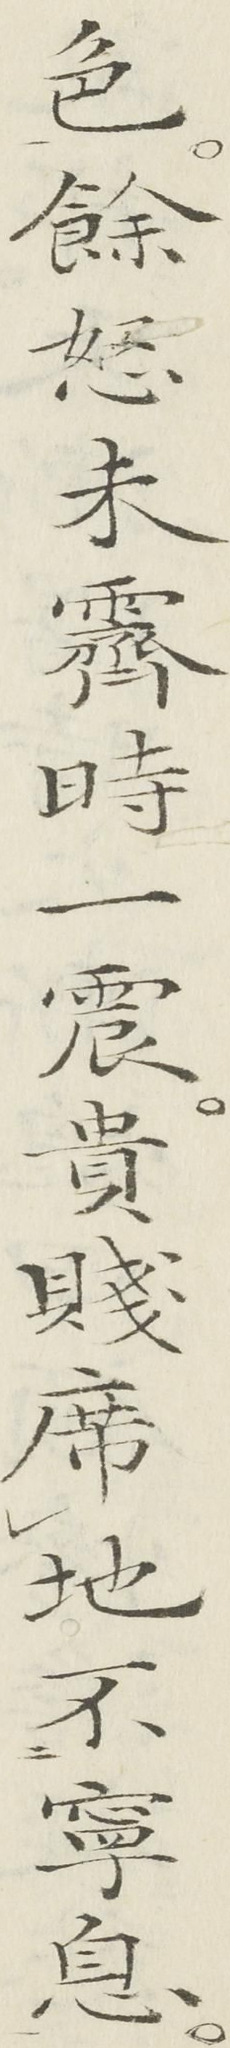色餘怒未霽時一震貴賤席地不寧息
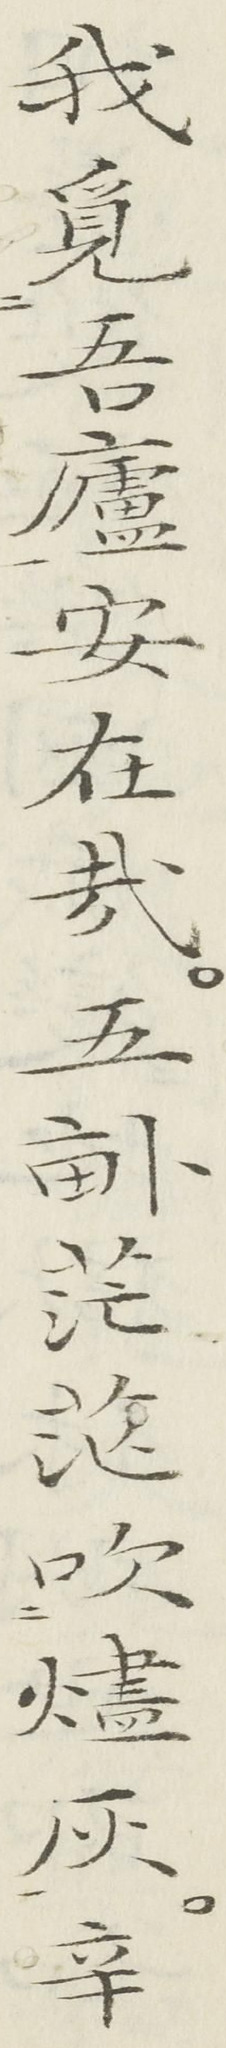我覓吾廬安在哉五畝茫茫吹儘灰辛
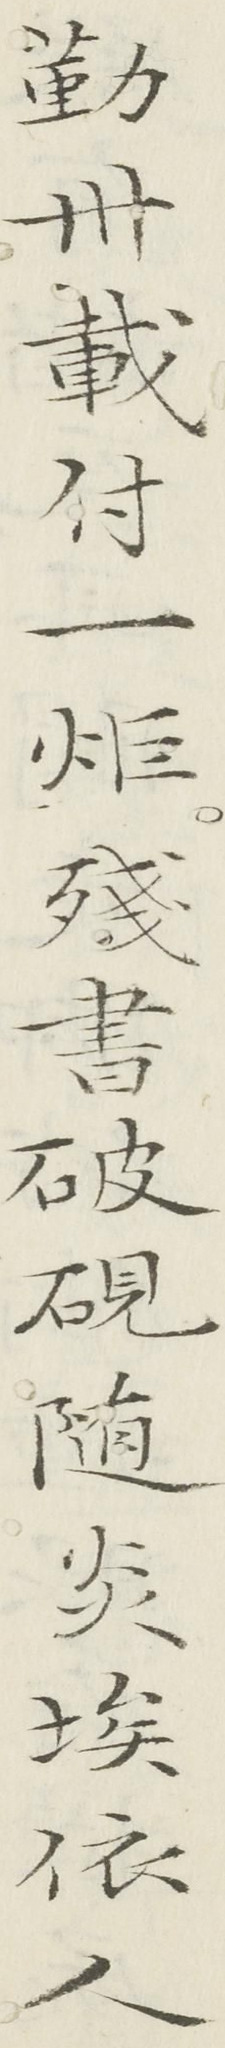勤卅載付一炬残書破硯随炎埃依人
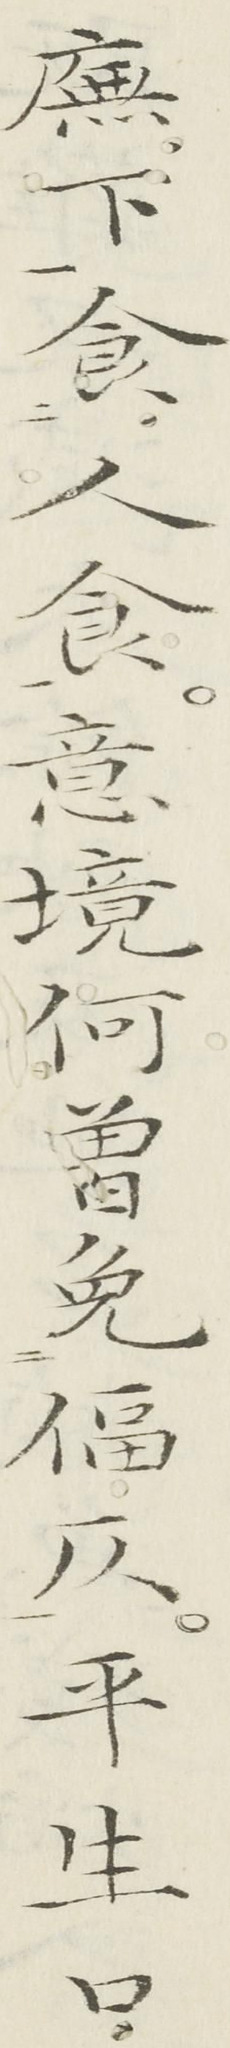廡下食人食意境何曽免偪仄平生口
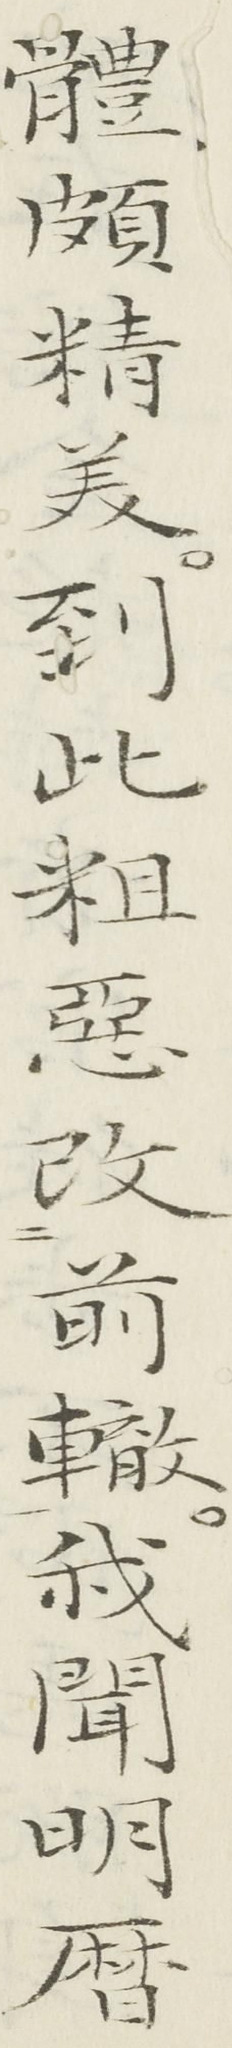体頗精美到此粗悪改前轍我聞明暦
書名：地震考證　全
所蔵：東京大学地震研究所図書室 Earthquake Research Institute Library, The University of Tokyo, JAPAN
